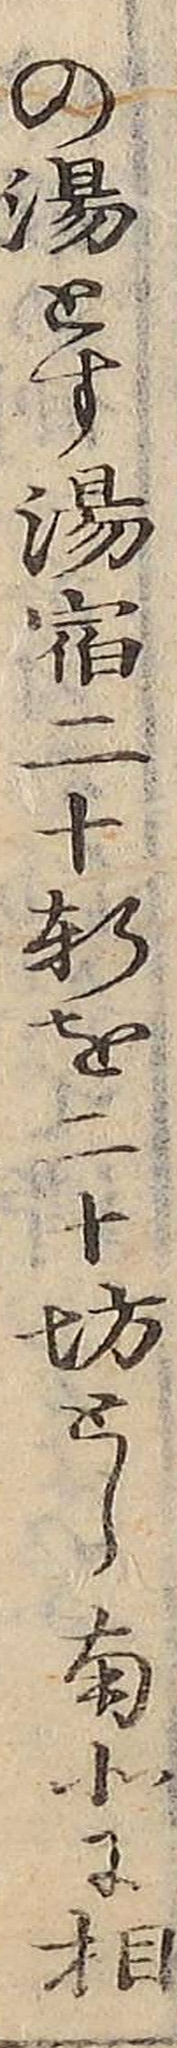の湯とす湯宿二十軒を二十坊とし南北に相
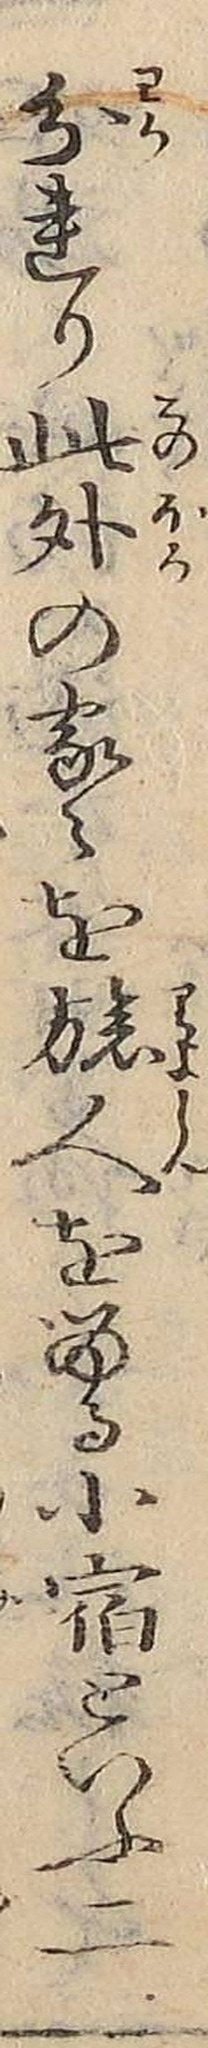分れり此外の家々を旅人を留る小宿といふ二
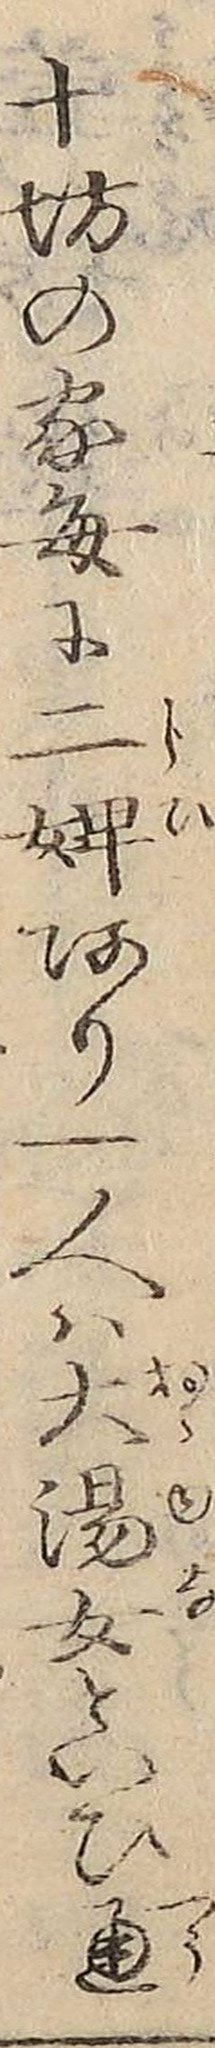十坊の家毎に二婢あり一人は大湯女といひ通
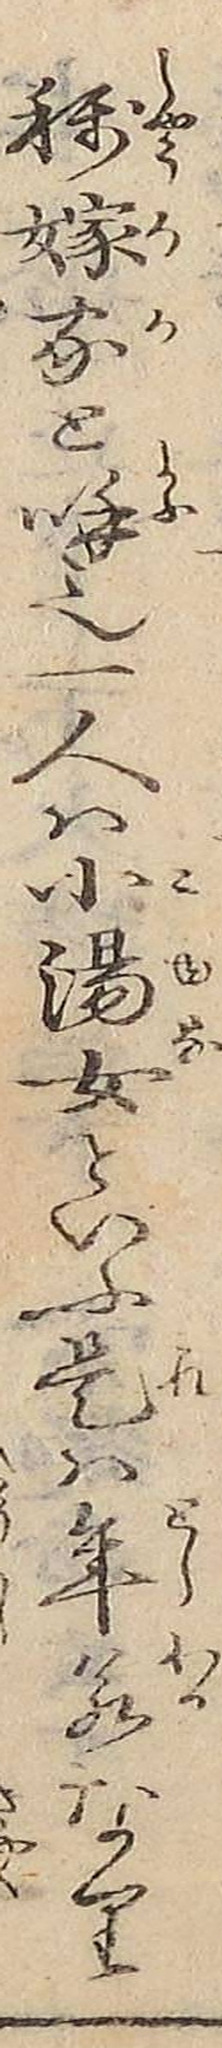称嫁家と呼也一人は小湯女といふ是は年若なり
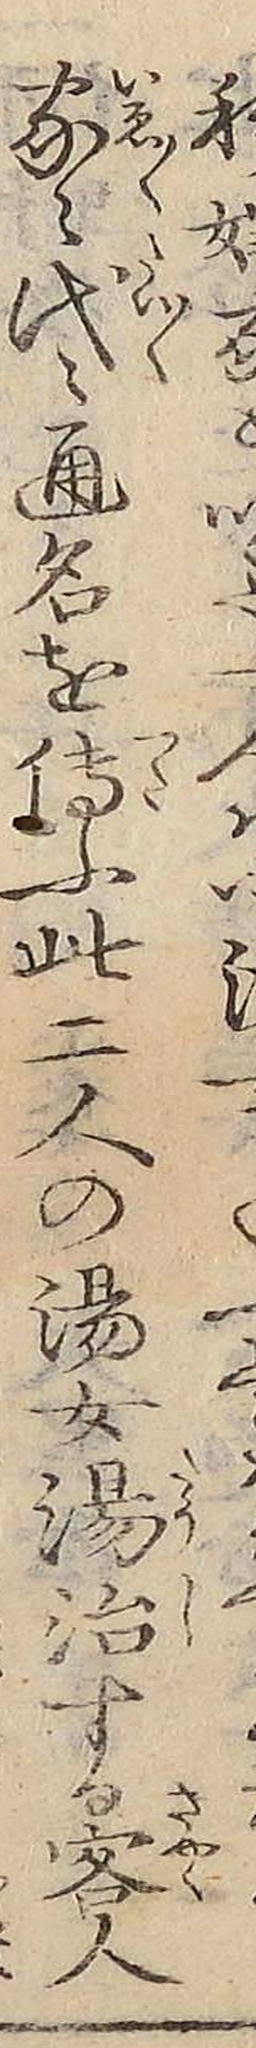家々代々通名を伝ふ此二人の湯女湯治する客人
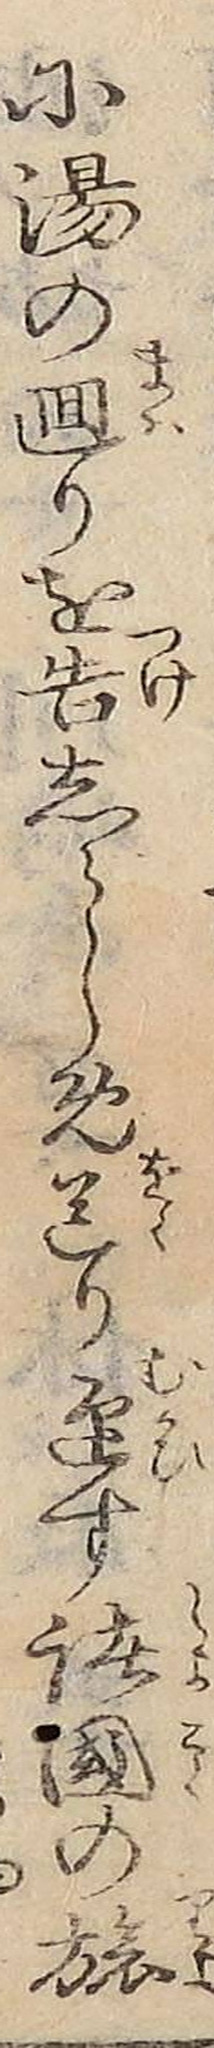に湯の廻りを告しらしめ送り迎す諸国の旅
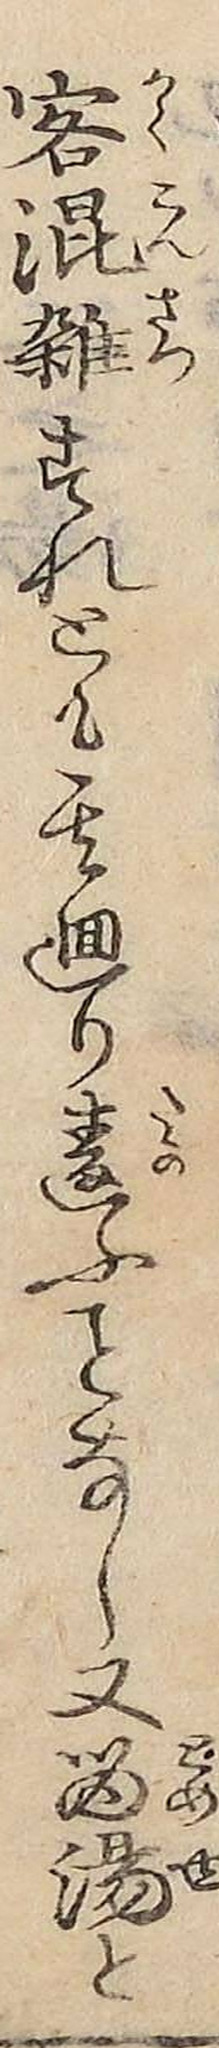客混雑すれとも其廻り違ふことなし又留湯と
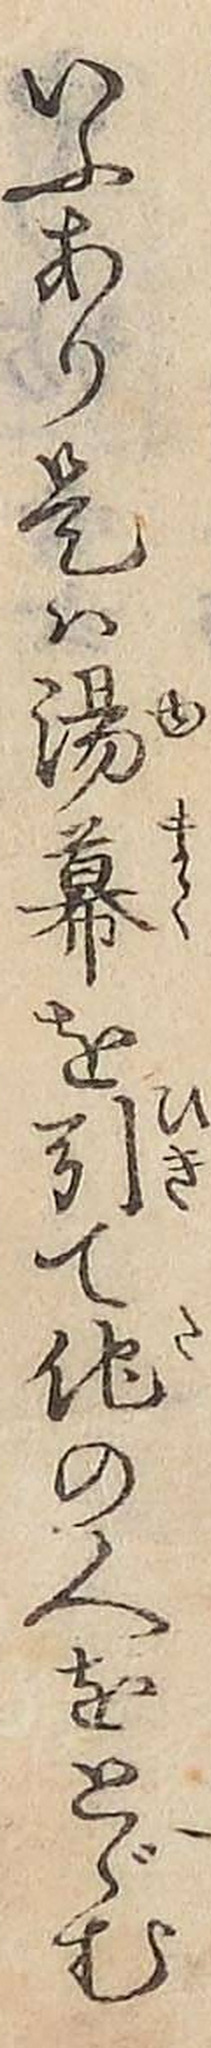いふあり是は湯幕を引て他の人をとゞむ
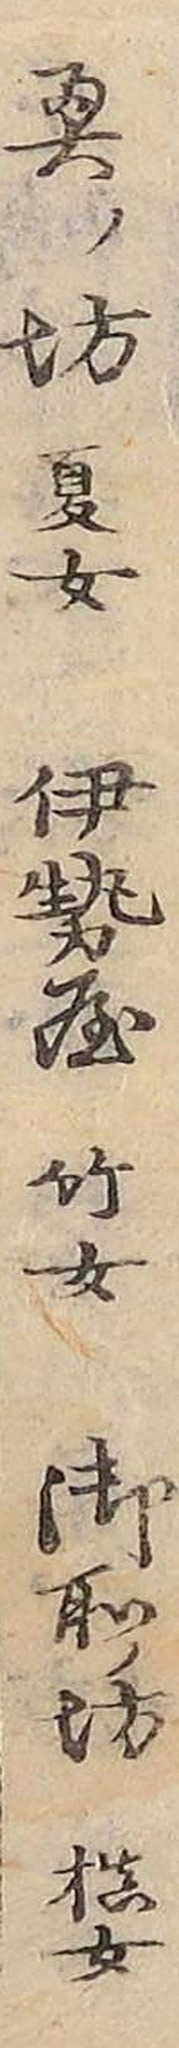奥ノ坊夏女伊勢屋竹女御所ノ坊桔女

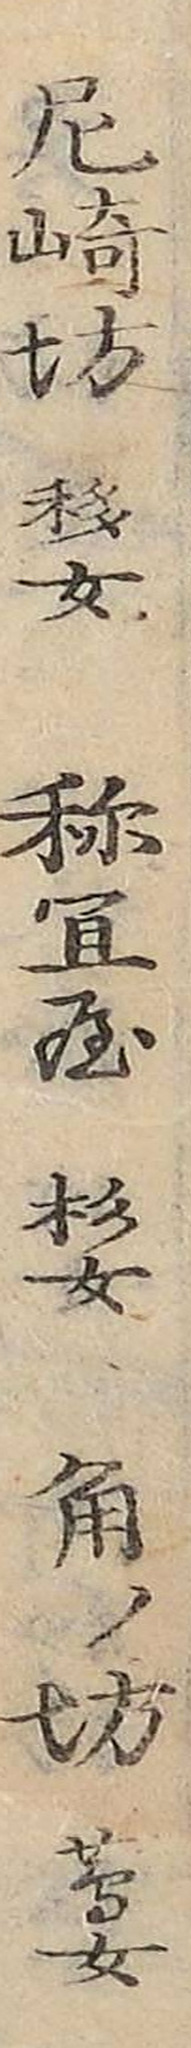尼崎坊移女称宜屋杉女角ノ坊蔦女
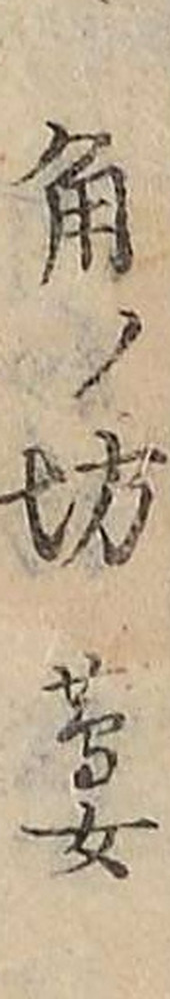中ノ坊常女
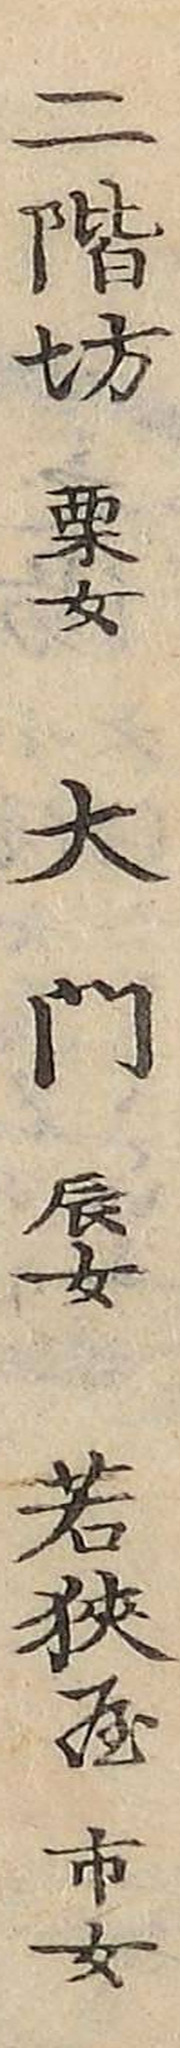二階坊栗女大門辰女若狭屋市女
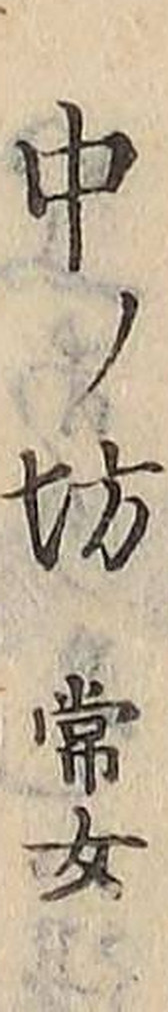中ノ坊常女
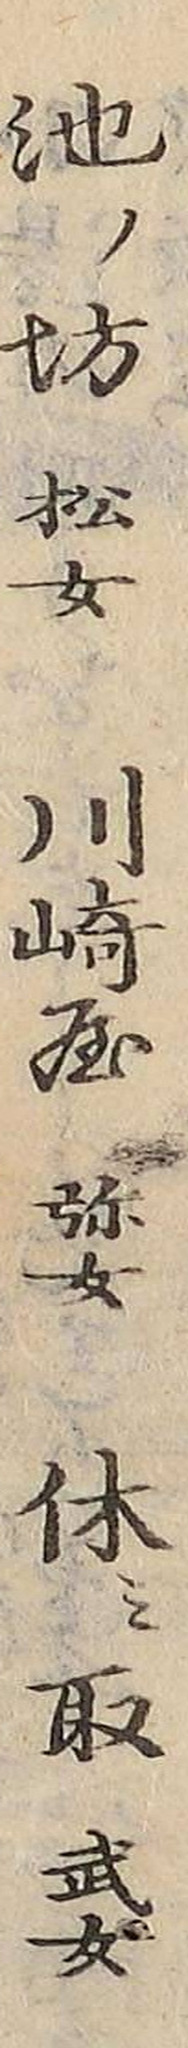池ノ坊松女川崎屋弥女休取武女
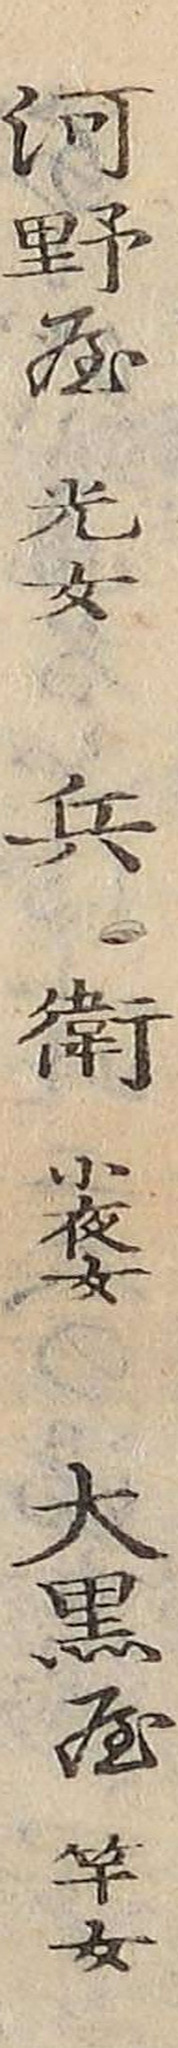河野屋光女兵衛小夜女大黒屋竿女
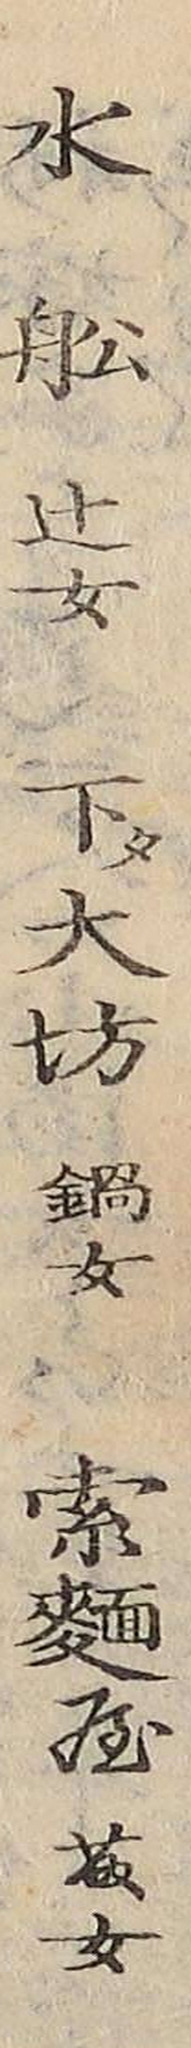水船辻女下大坊鍋女索麺屋藤女
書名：旅行用心集
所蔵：神戸大学附属図書館 国文学研究資料館
